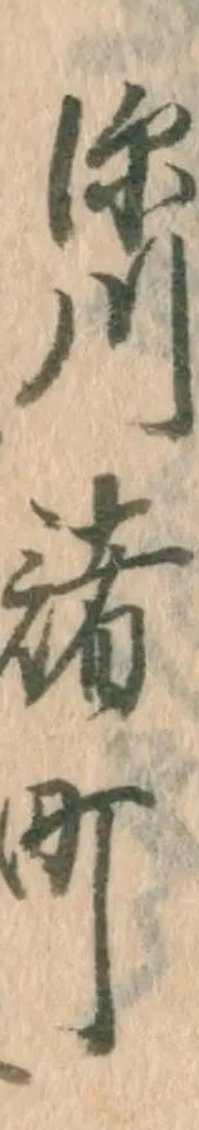深川諸町
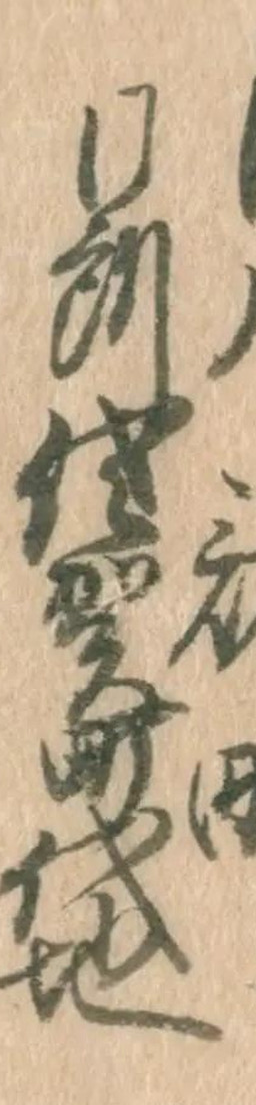同所佐賀町代地
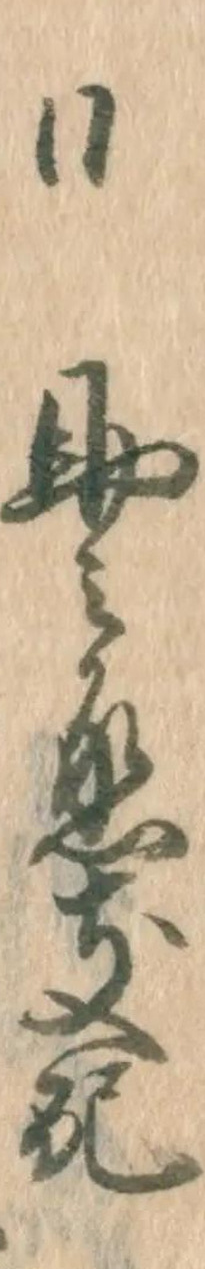同助之丞支配
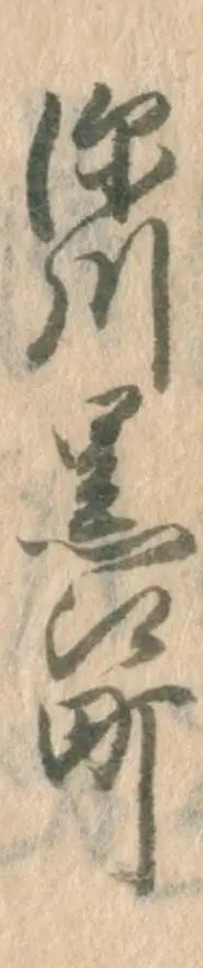深川黒江町

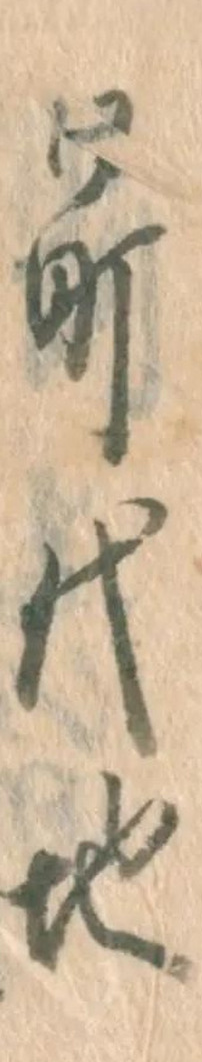同町代地
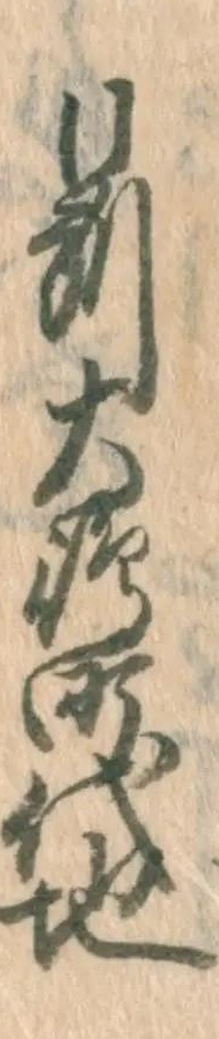同所大嶋町代地
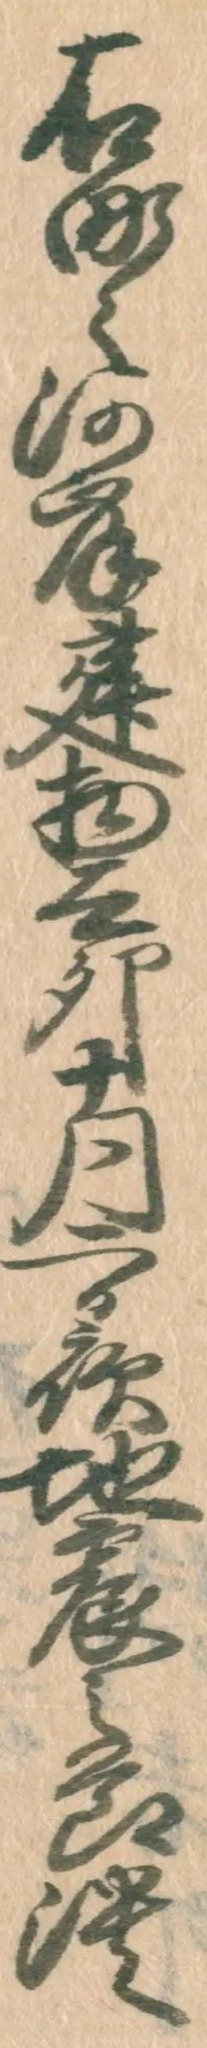右町〻河岸建物去卯十月二日夜地震之節潰
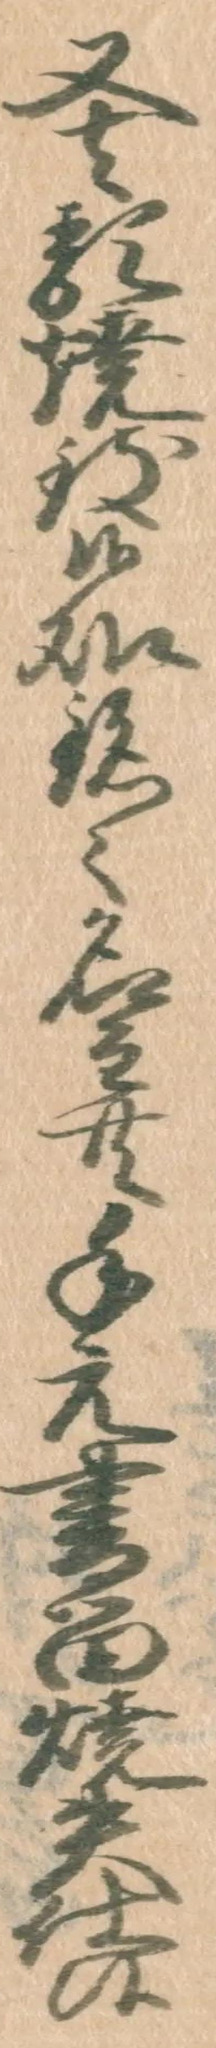又は類焼致候処銘〻名主共手元書留焼失仕候
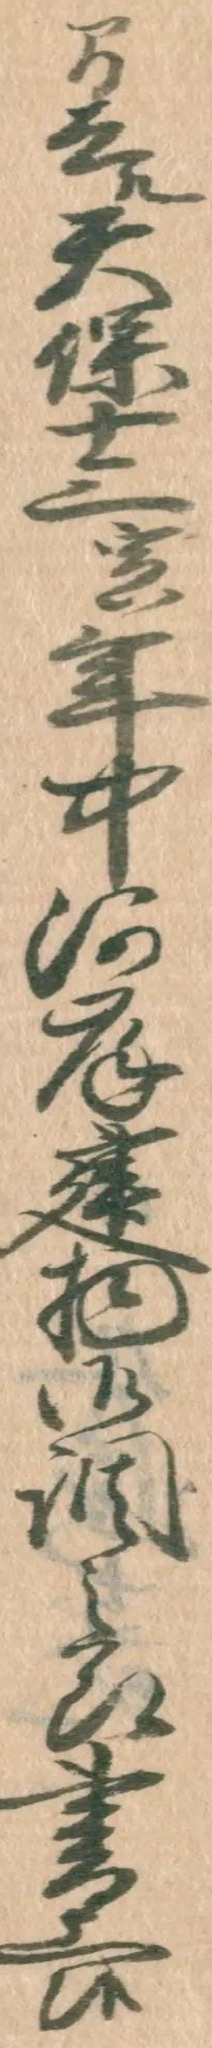間去ル天保十三寅年中河岸建物御調之節書上候
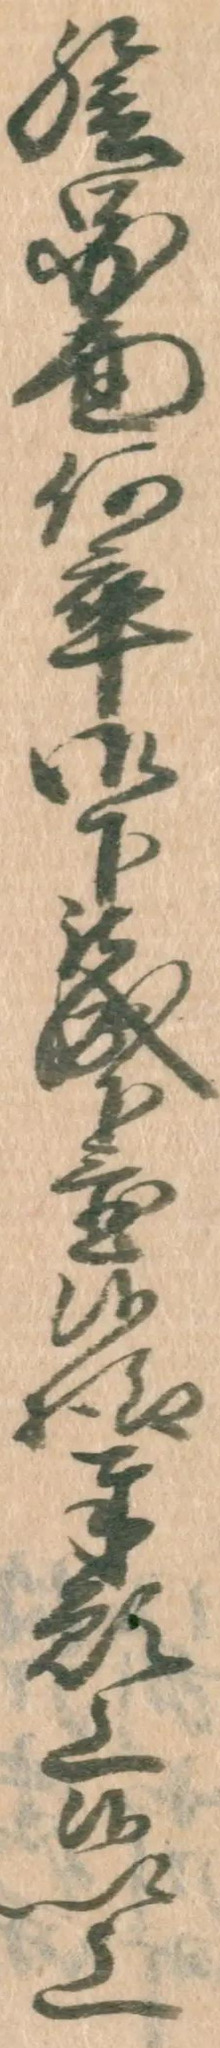絵図面何卒御下被成下置候様奉願上候以上
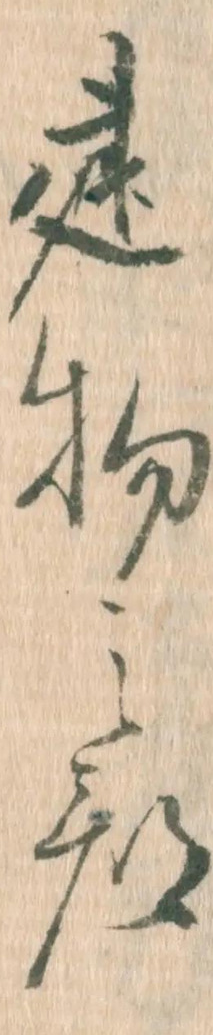建物之部

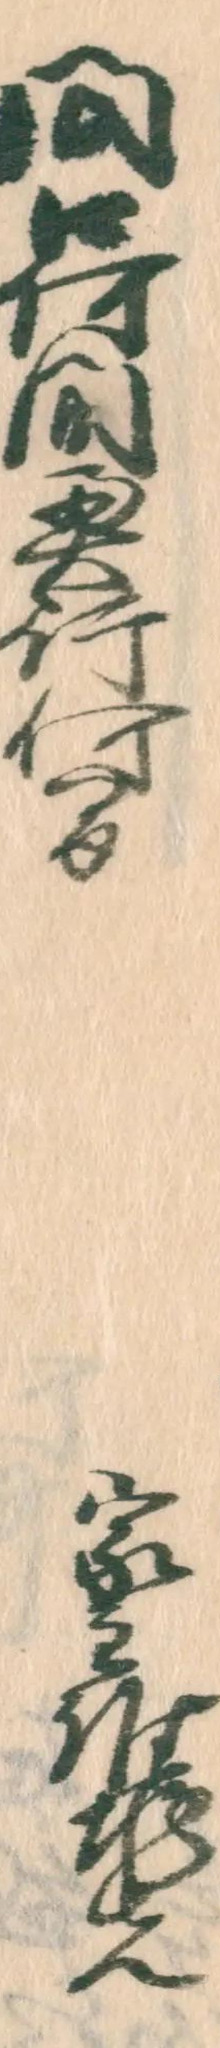間口何間奥行何間家主誰地先
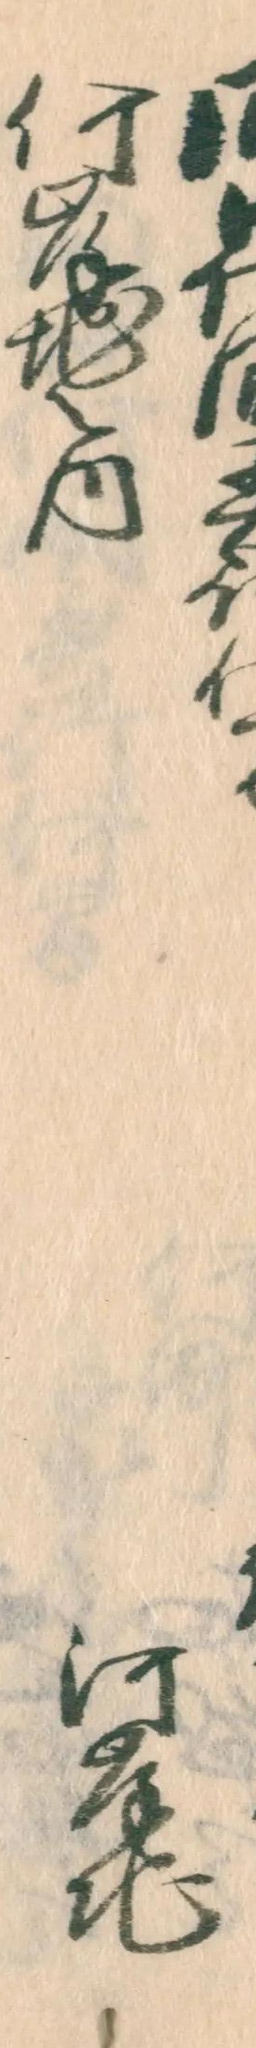何岸地之内河岸地
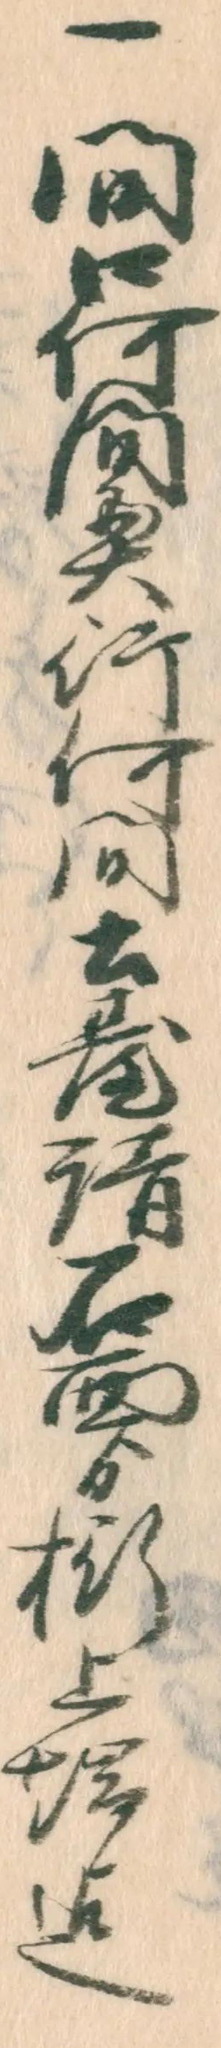一間口何間奥行何間土蔵請石面ゟ桁上端迄
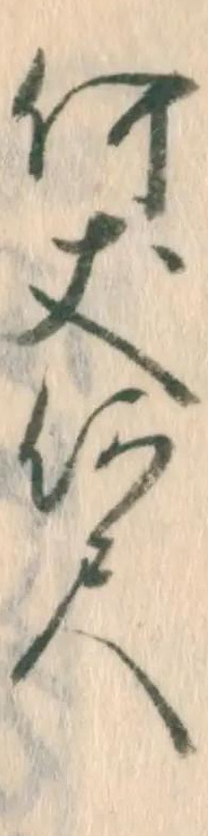何丈何尺
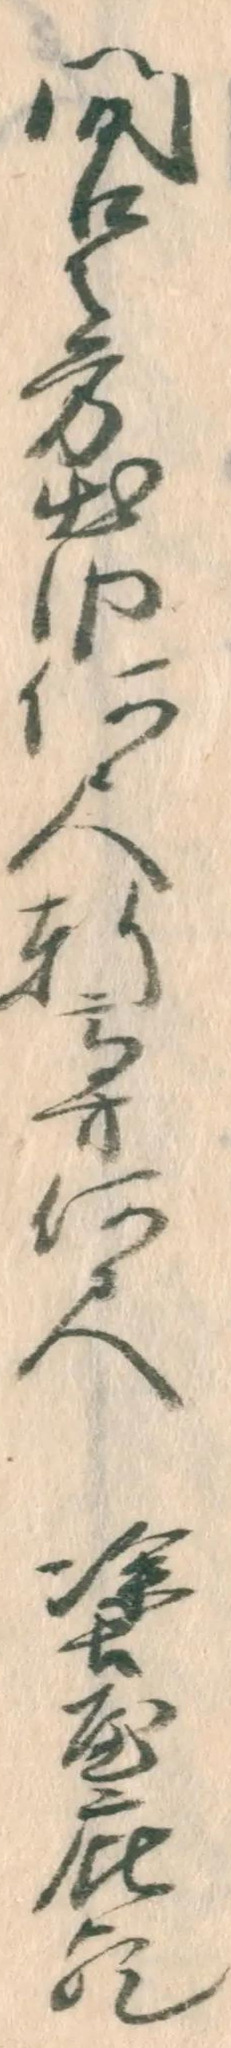間口之方出巾何尺棟高サ何尺塗屋庇歟
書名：地震災書留 2巻. [1] 内表紙に「地震災書留　安政二卯年　但本所深川御用屋敷地代免除調」とあり
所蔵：国立国会図書館 National Diet Library, JAPAN
